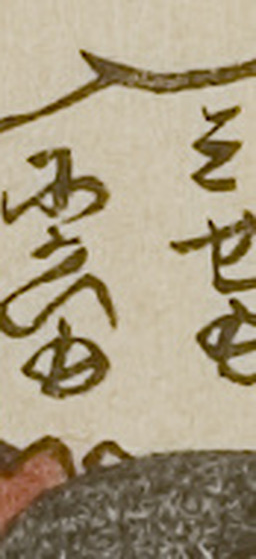にかいも
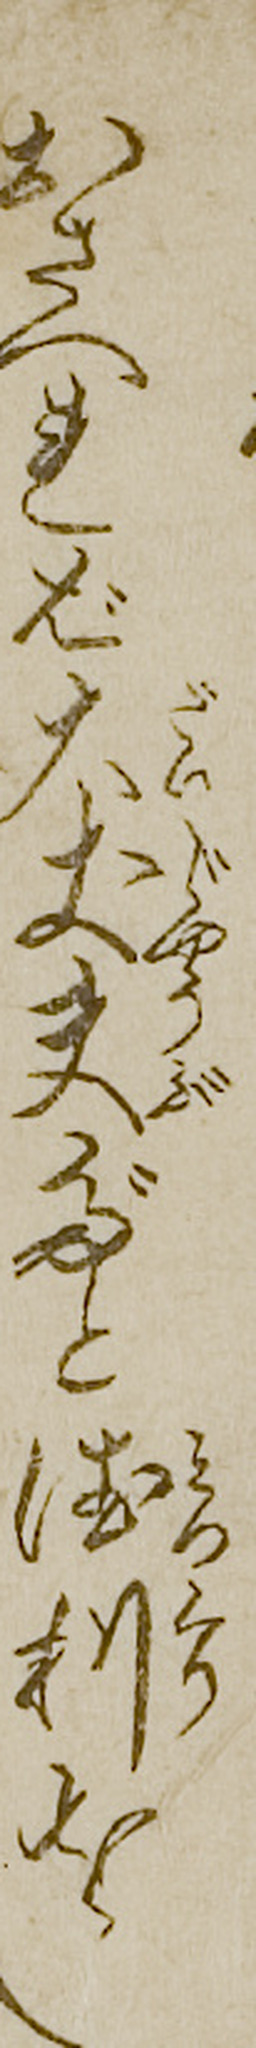おさへれば大丈夫だと徳利を
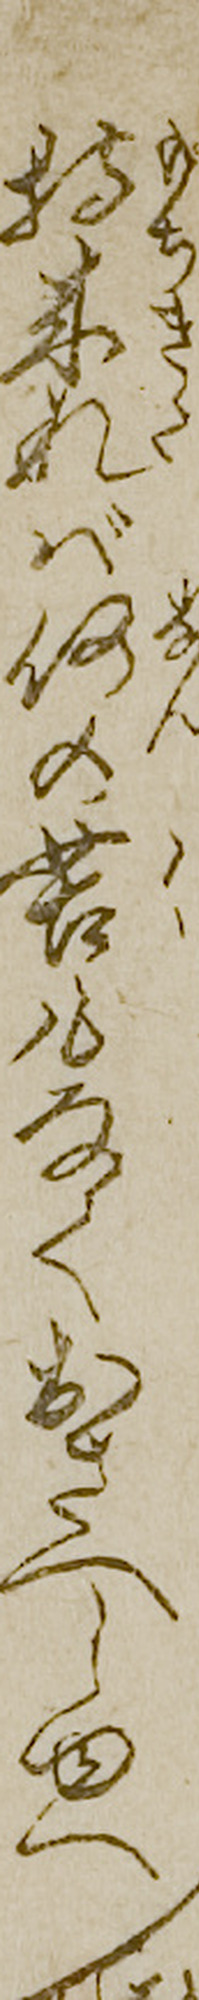持来れバ何の苦もなくおさへしゆへ
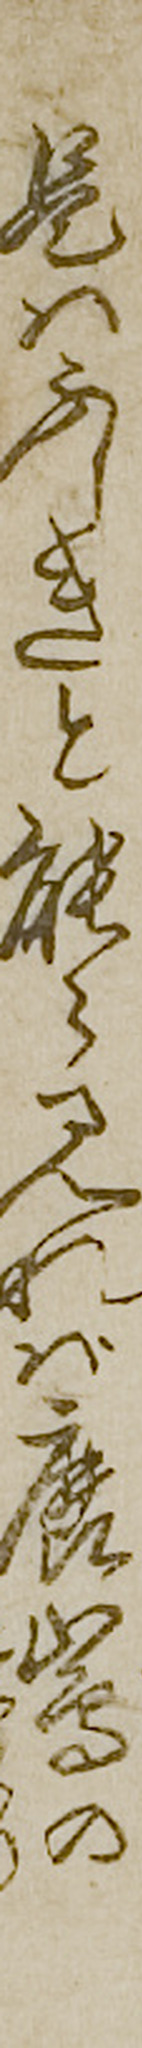是ハふしきと能々見れバ鹿嶋の
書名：治る御代ひやかし鯰
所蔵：東京大学総合図書館 General Library in the University of Tokyo, JAPAN
